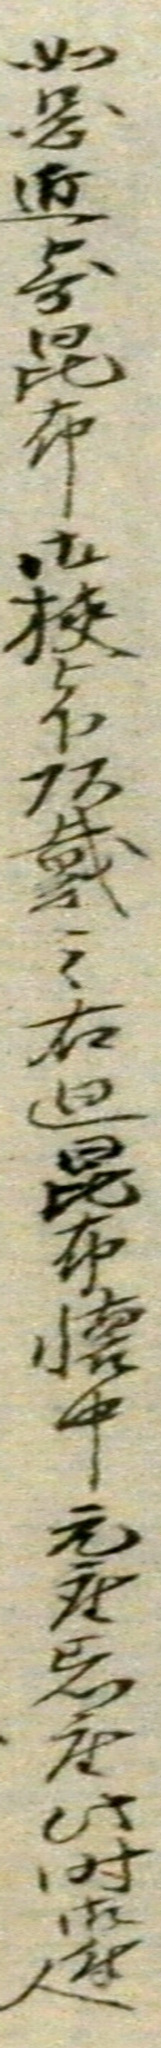如図進寄昆布御挟被下頂戴之右廻昆布懐中元座着座此時御付人
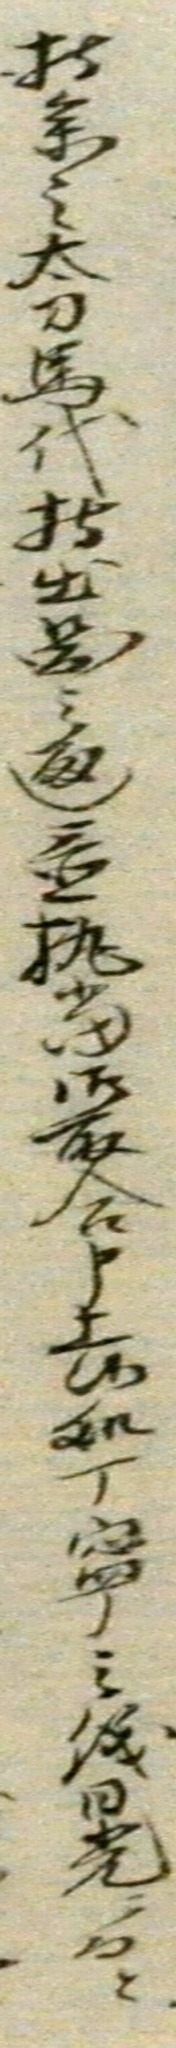持参之太刀馬代持出図之通置執当御取合申上候処丁寧之儀日光ニ而と
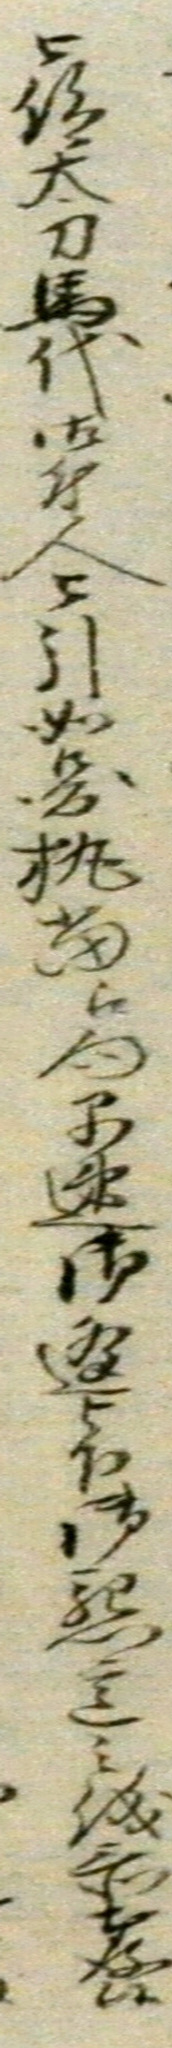被仰太刀馬代御付人被引如図執当え向早速御逢被下御懇意之儀忝奉存候
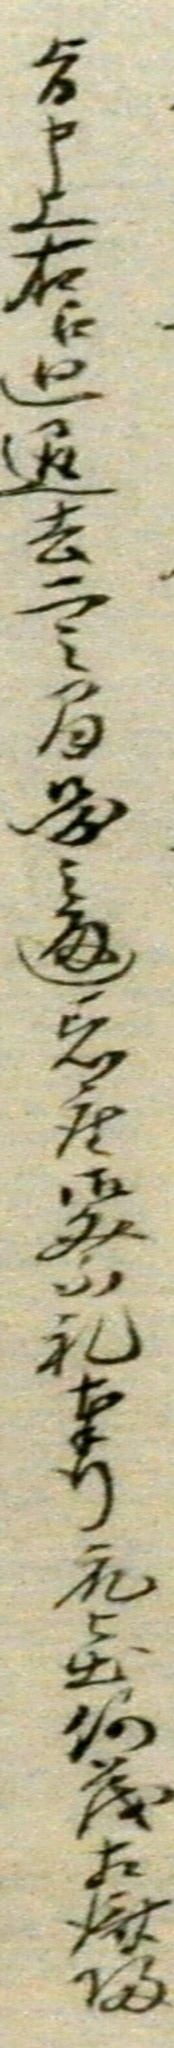旨申上右え廻退去二之間図之通着座御祭礼奉行衆被出何も相済帰
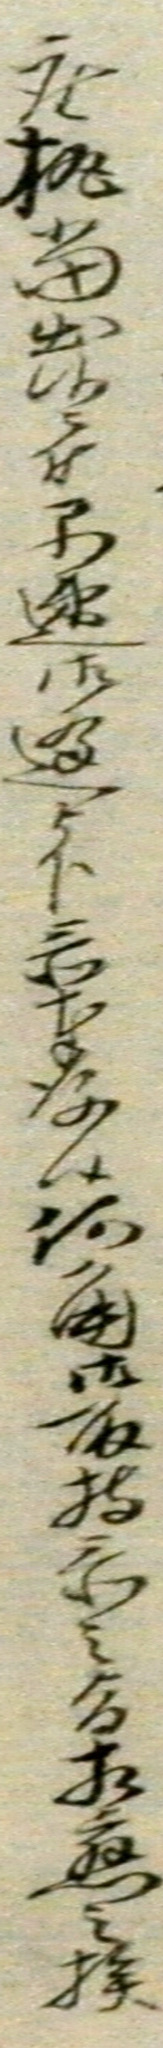座執当出候ニ付早速御逢被下忝奉存候何角御取持忝之旨相応之挨
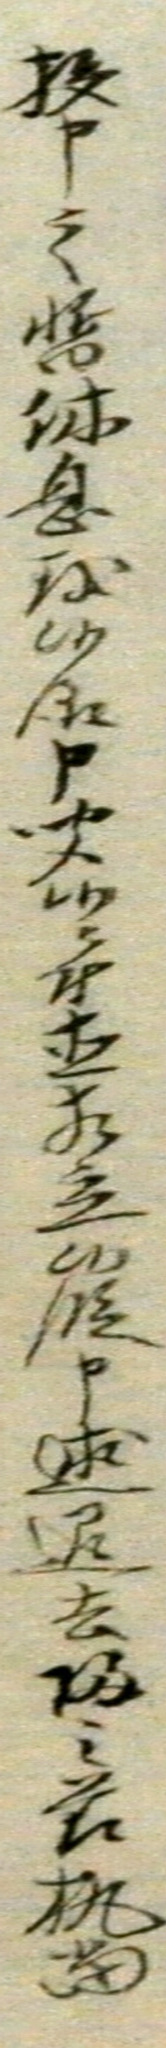拶申之暫休息致候様申聞候ニ付直相立候段申述退去帰之節執当
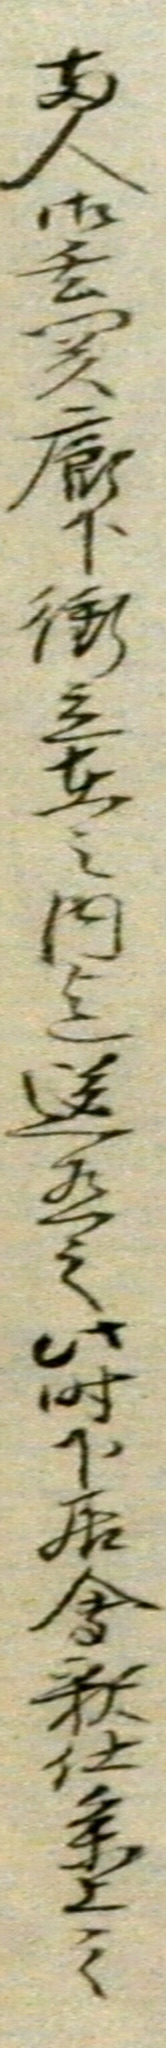両人御玄関廊下衝立在之内迄送有之此時下居会釈仕参上之
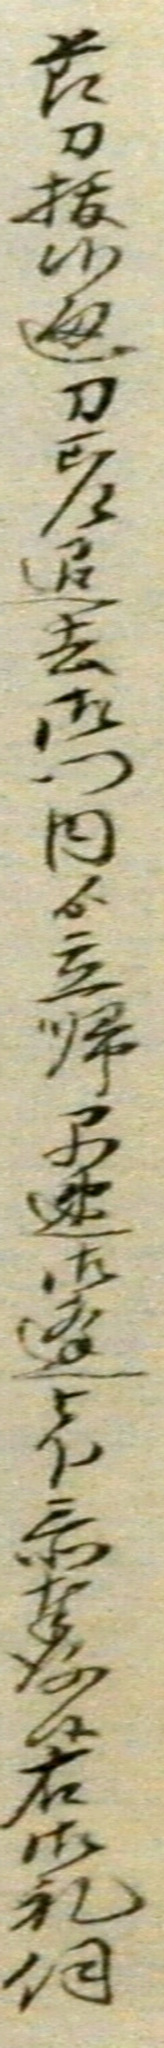節刀抜候通刀差退去御門内ゟ立帰早速御逢被下忝奉存候右御礼伺
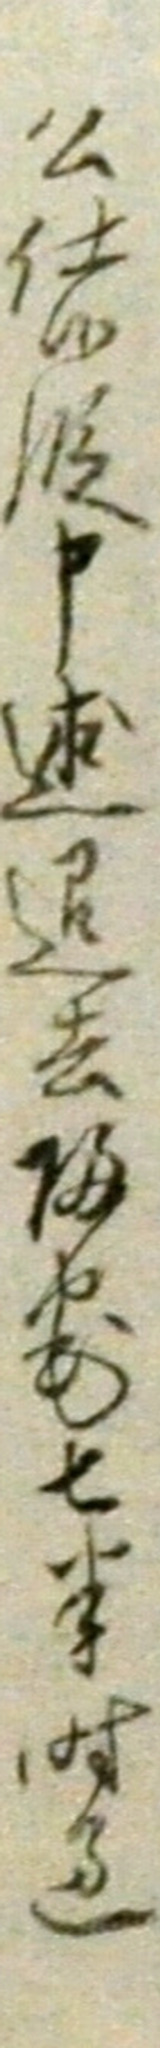公仕候段申述退去帰宅七半時過

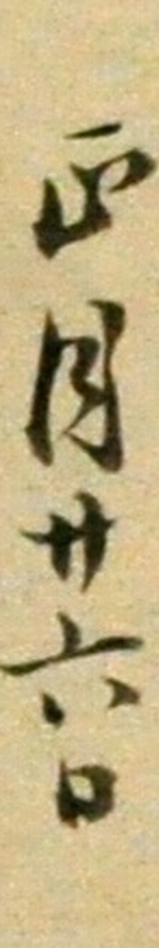正月廿六日
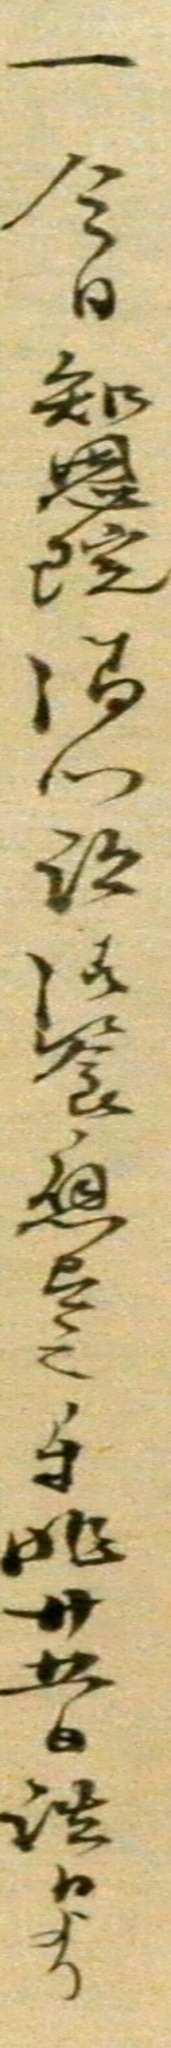一今日知恩院御門跡御饗応有之ニ付昨廿五日詰日より
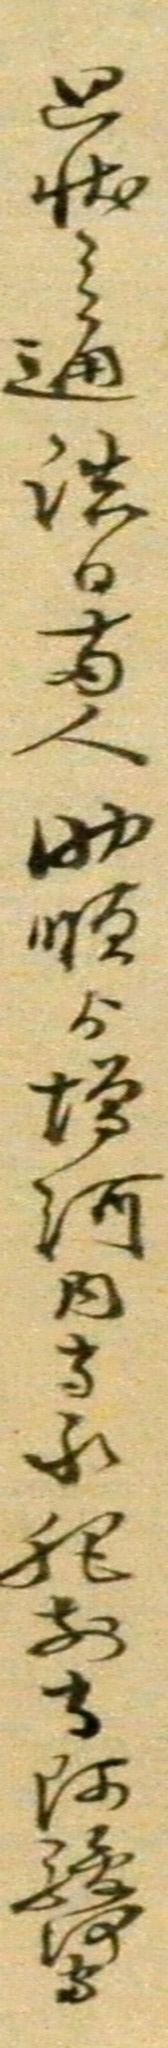廻状之通詰日両人助順ゟ増河内守永肥前守阿駿河守
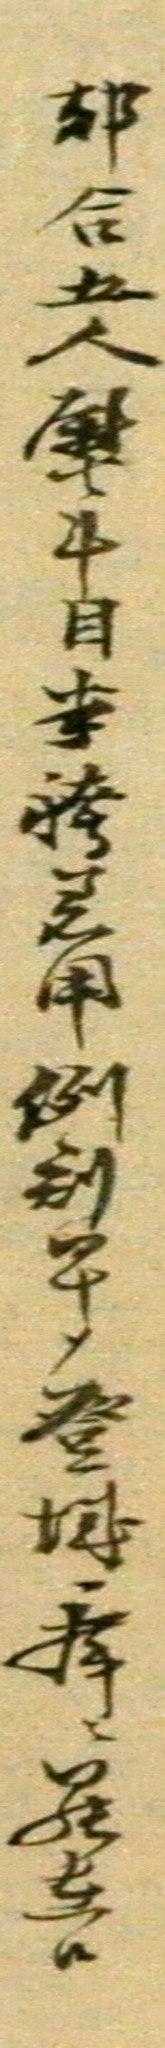都合五人熨斗目半袴着用例刻早メ登城奉ニ罷在候
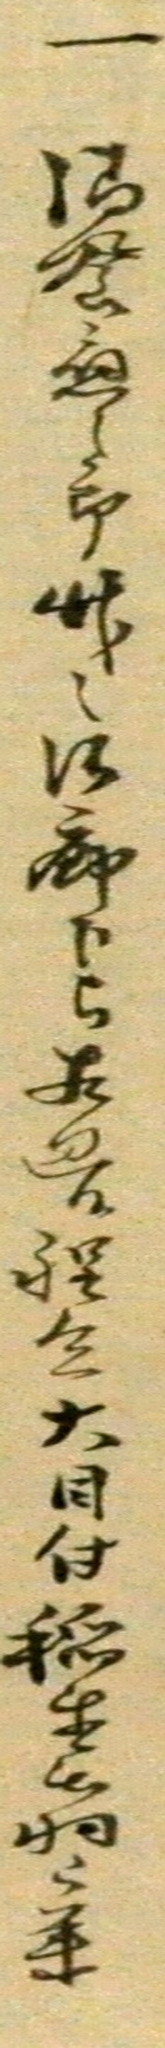一御饗応之節竹之御廊下ゟ相廻り程無大目付稲生出羽被参
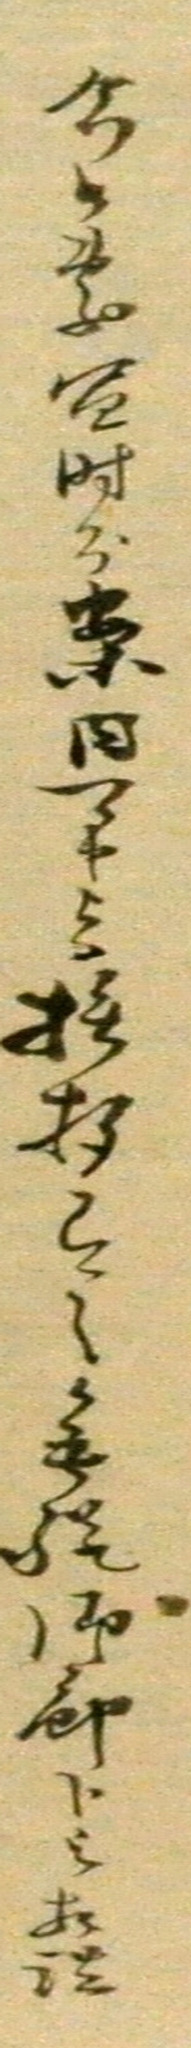処宜時分案内可申旨挨拶有之無程御廊下え相詰
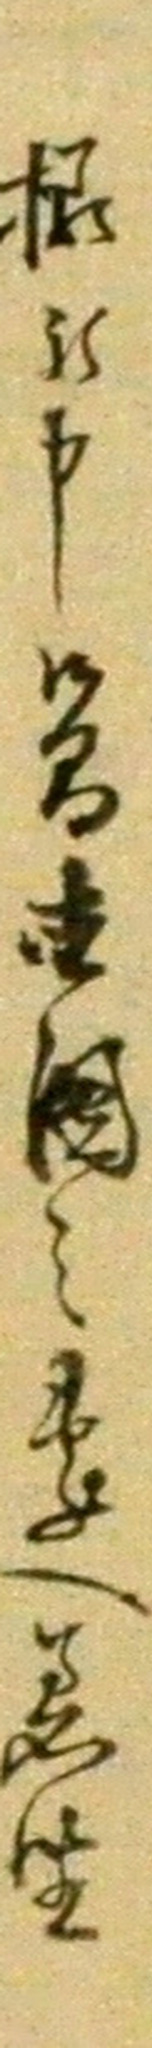様被申候間直図之処へ着坐
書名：諸留書〔一括〕
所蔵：伊那市立高遠町図書館・合同会社AMANE
